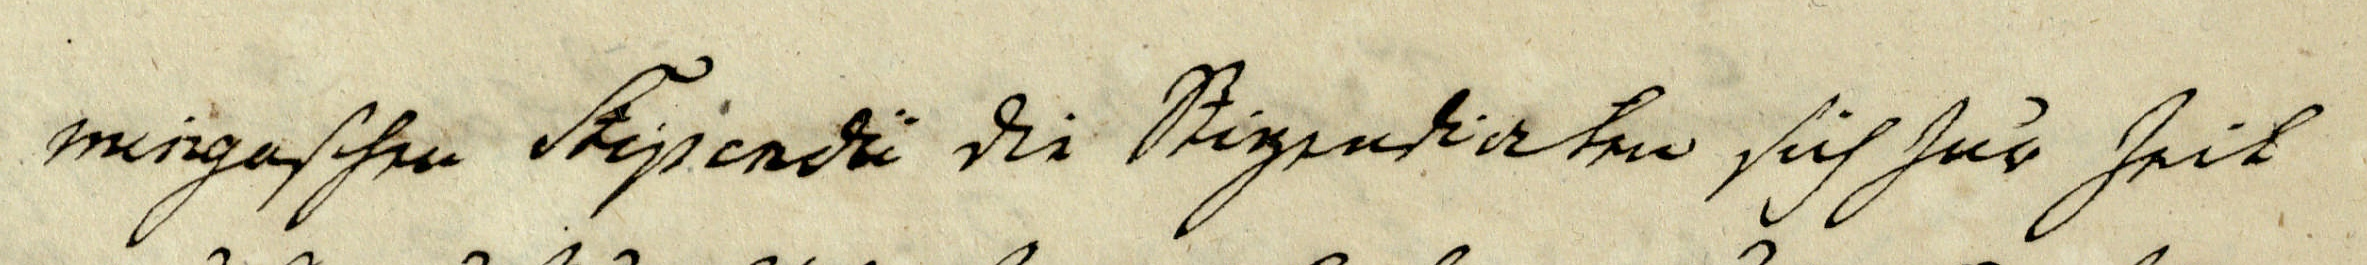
mingaschen Stipendii die Stipendiaten sich zur Zeit
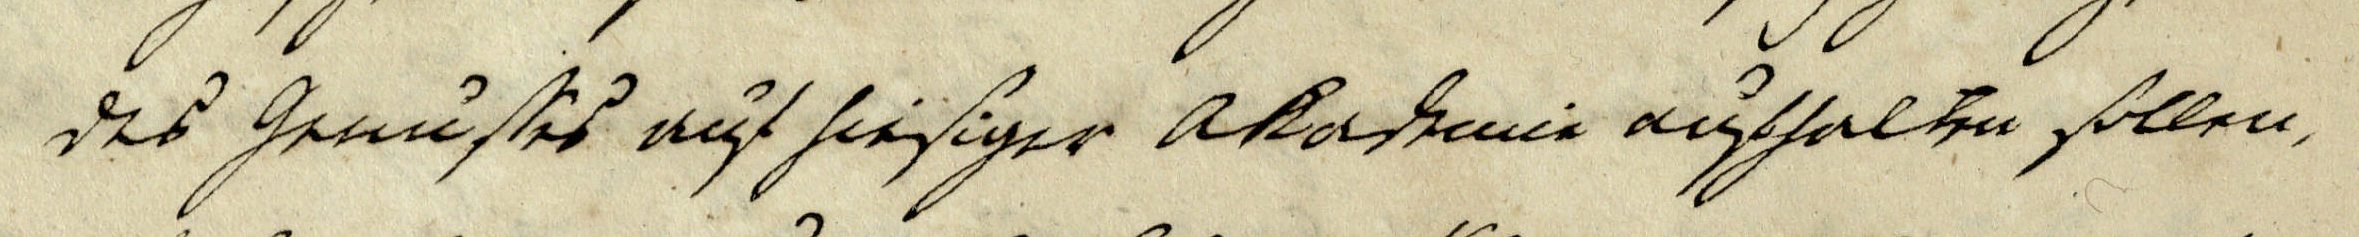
des Genusses auf hiesiger Akademie aufhalten sollen,
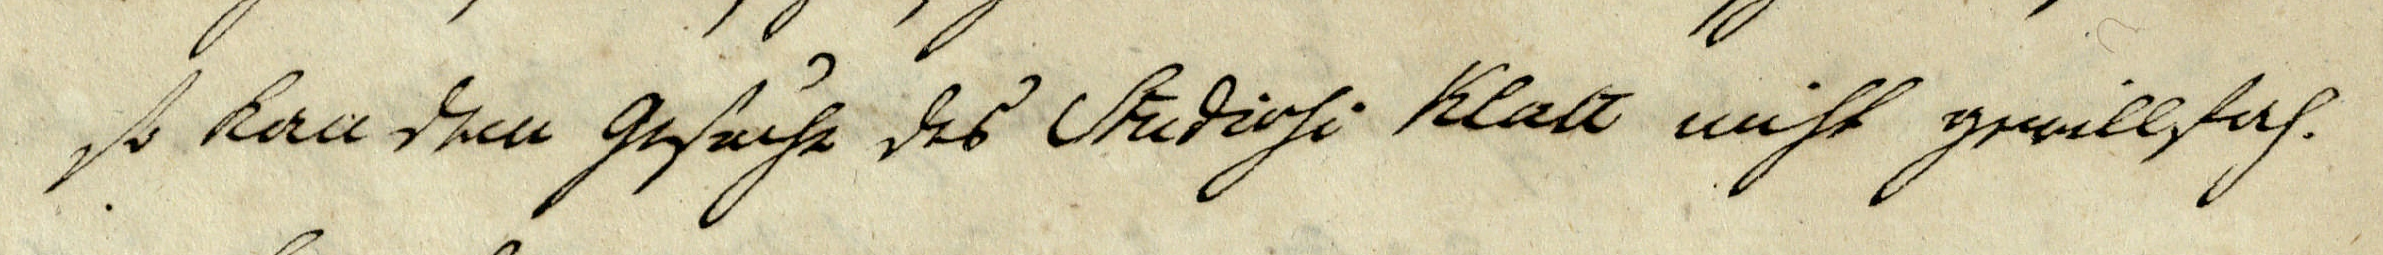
so kan dem Gesuche des Studiosi Klatt nicht gewillfah¬
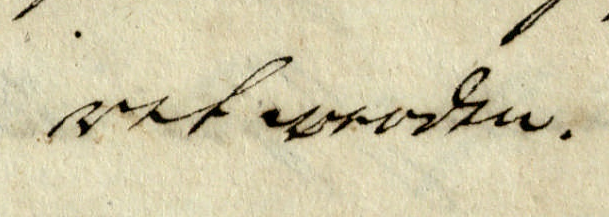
ret werden.
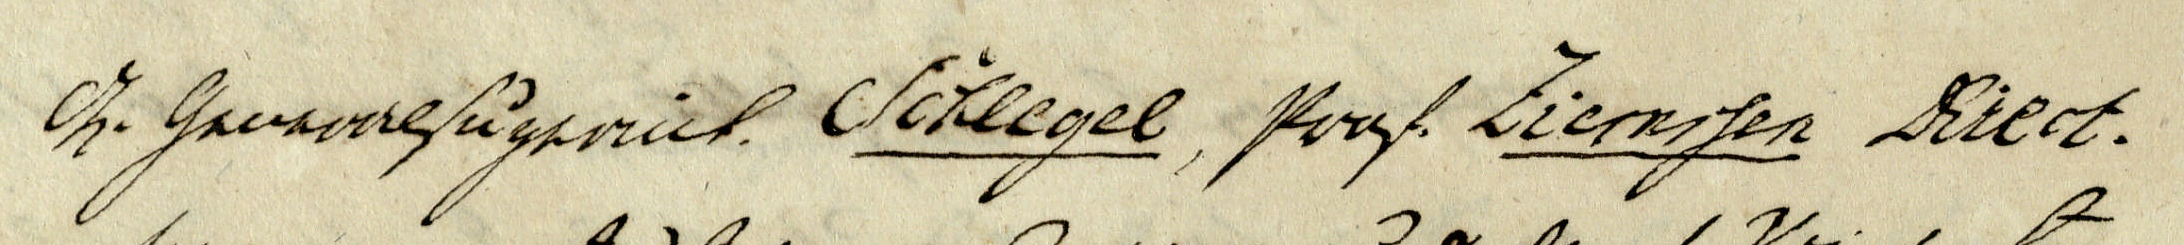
dh. Generalsuperint Schlegel, Prof. Ziemssen Direct.
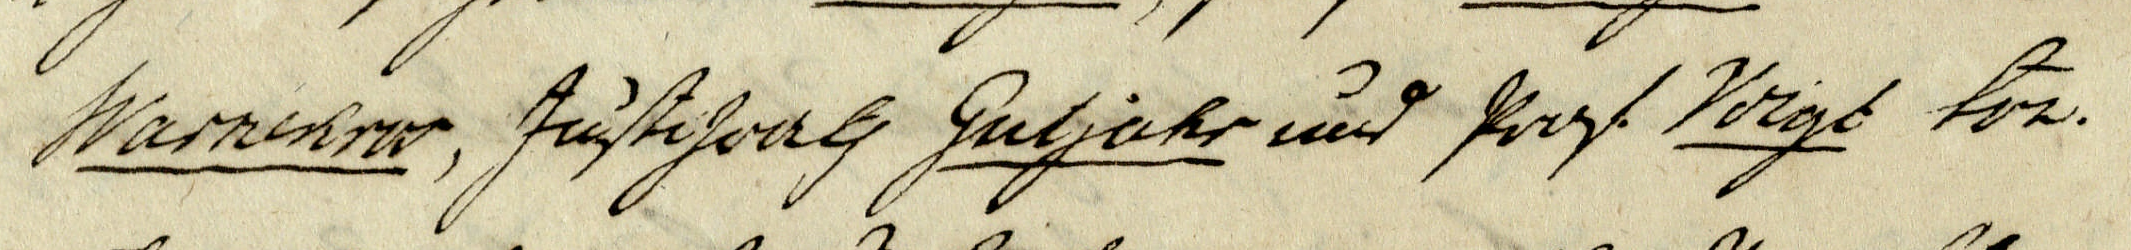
Warnekros, Justizrath Gutjahr und Prof Voigt tre¬
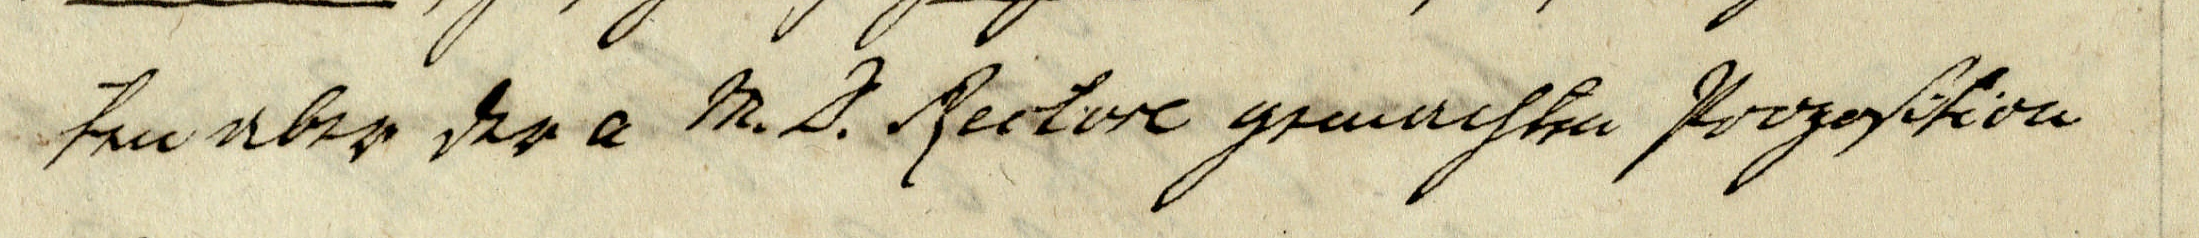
ten aber der a M. D. Rectore gemachten Proposition
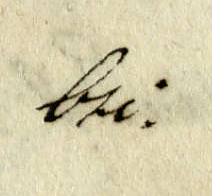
bei.
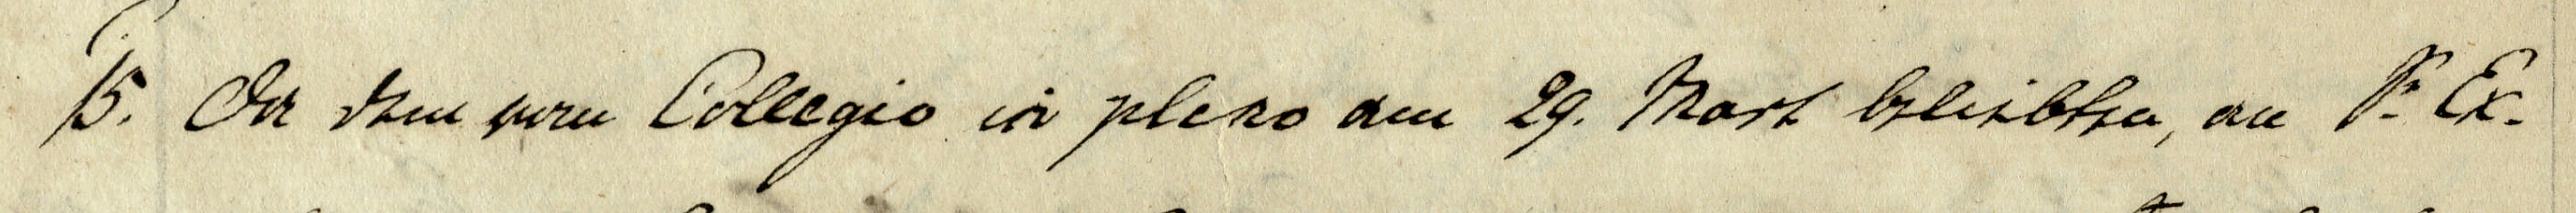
15. Da dem vom Collegio in pleno am 29. Mart beliebten, an Sr Ex¬
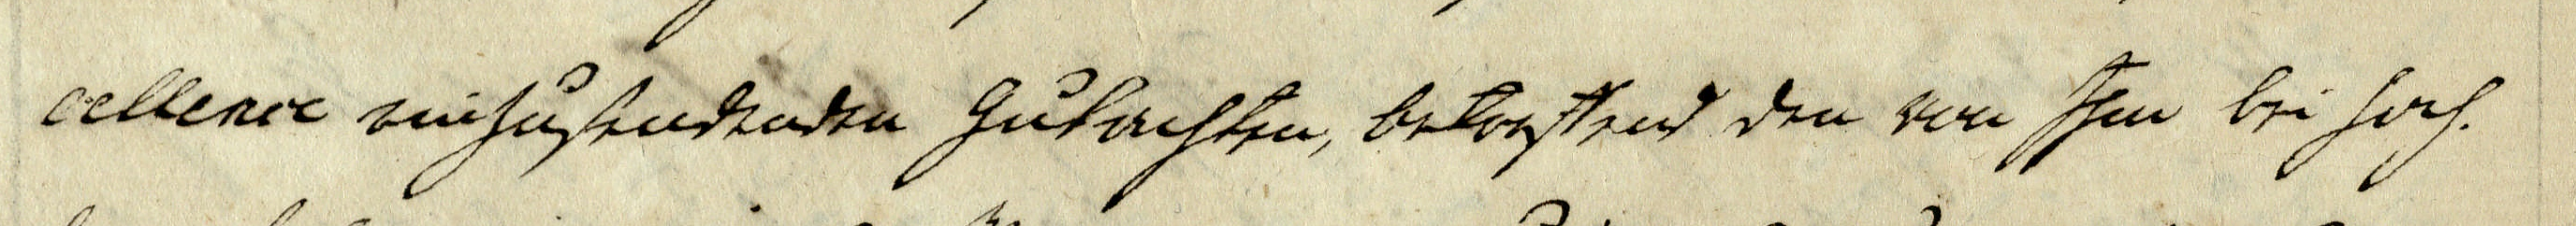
cellence einzusendenden Gutachten, betreffend den von Ihm bei hoch¬
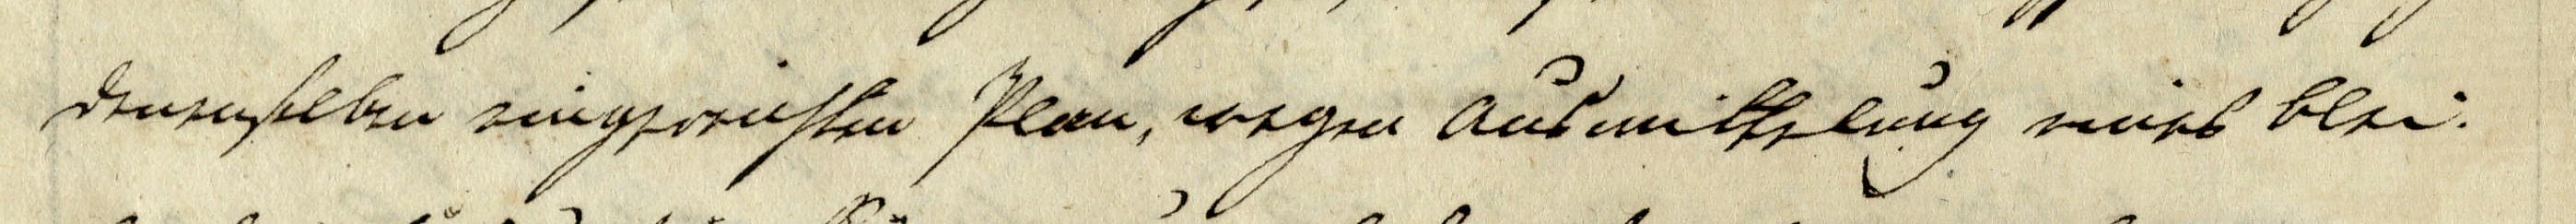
denenselben eingereichten Plan, wegen Ausmittelung eines bei¬
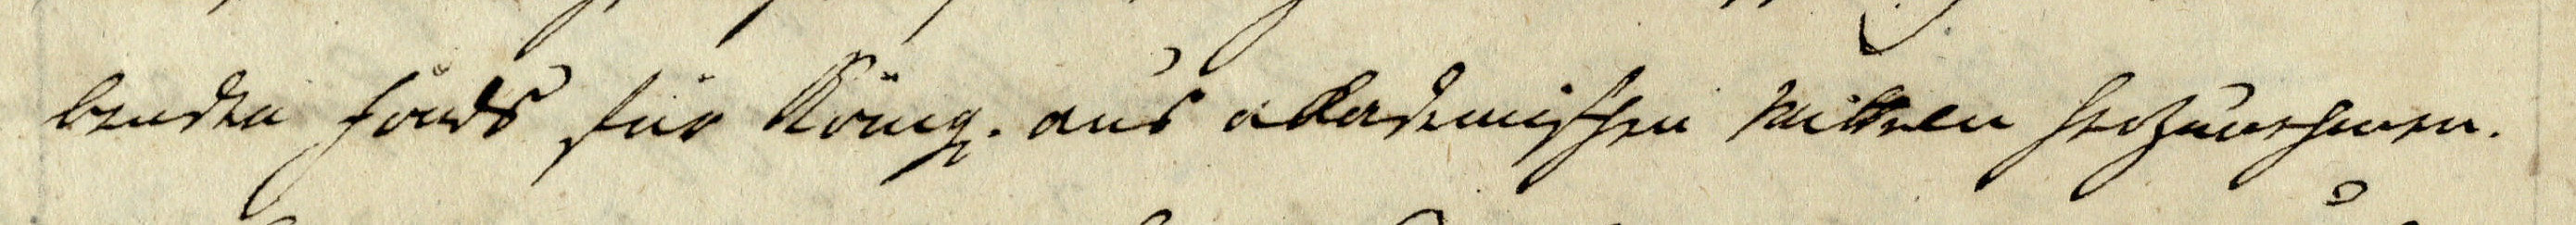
benden Fonds für König. aus akademischen Mitteln herzunehmen¬
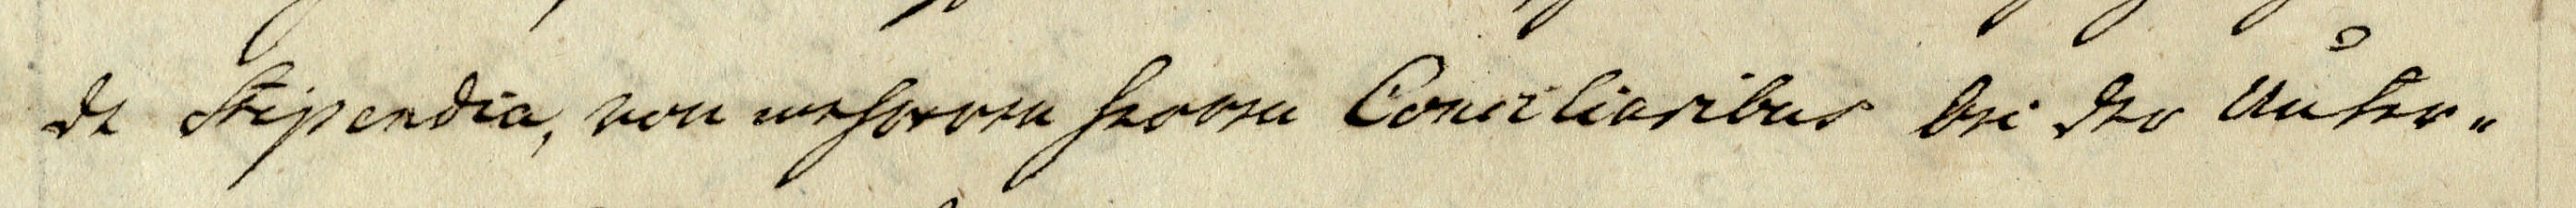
de Stipendia, von mehreren Herren Conciliaribus bei der Unter¬
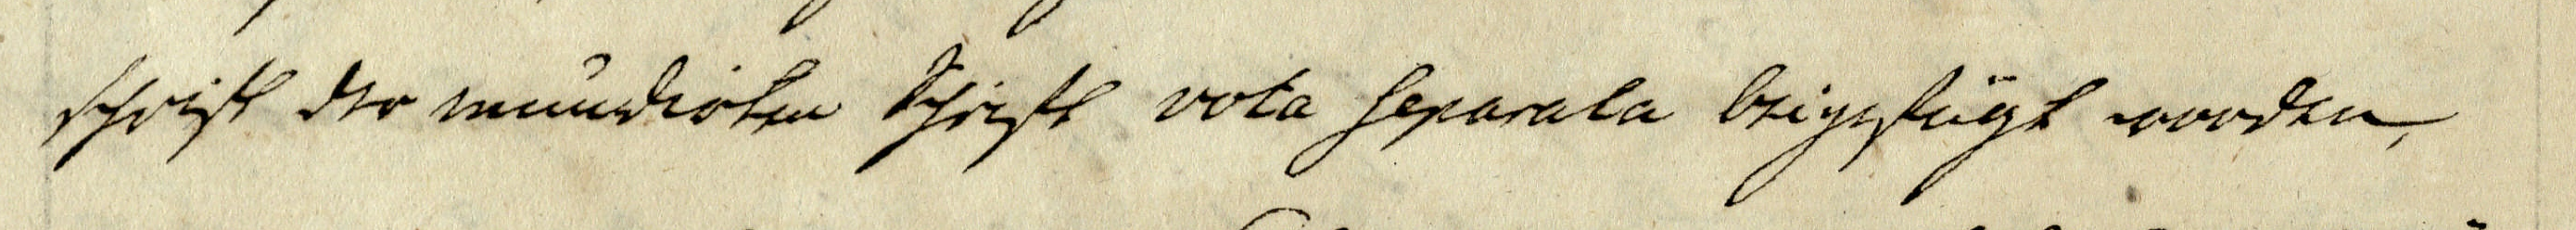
schrift der mundirten Schrift vota separata beigefügt worden,
